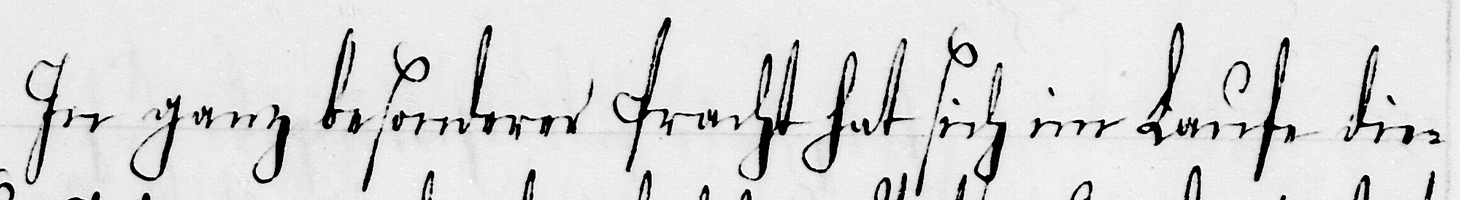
In ganz besonderer Pracht hat sich im Laufe die¬
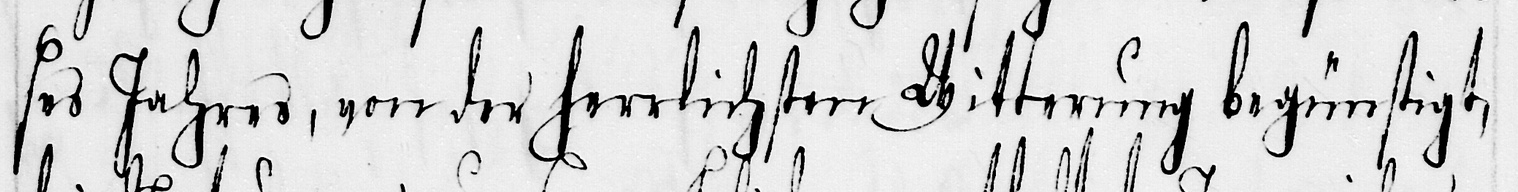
ses Jahres, von der herrlichsten Witterung begünstigt,
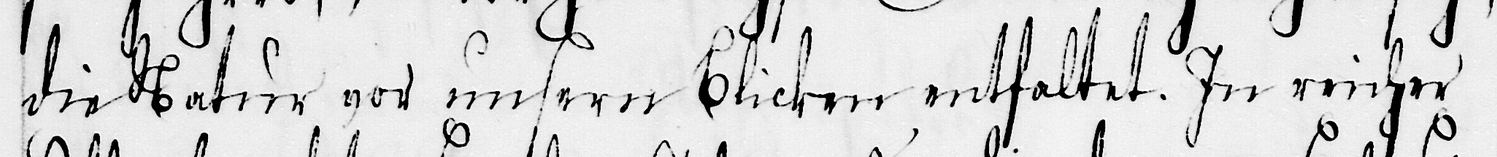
die Natur vor unsern Blicken entfaltet. In reicher
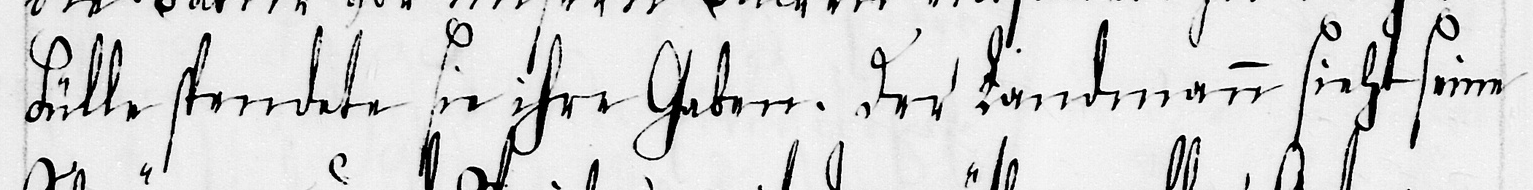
Fülle spendete sie ihre Gaben. Der Landmann sieht seine
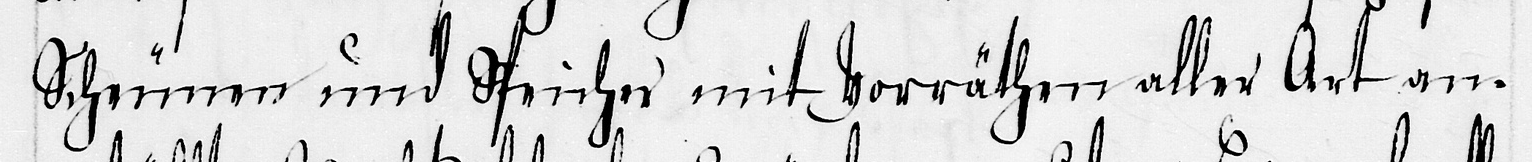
Scheunen und Speicher mit Vorräthen aller Art an¬
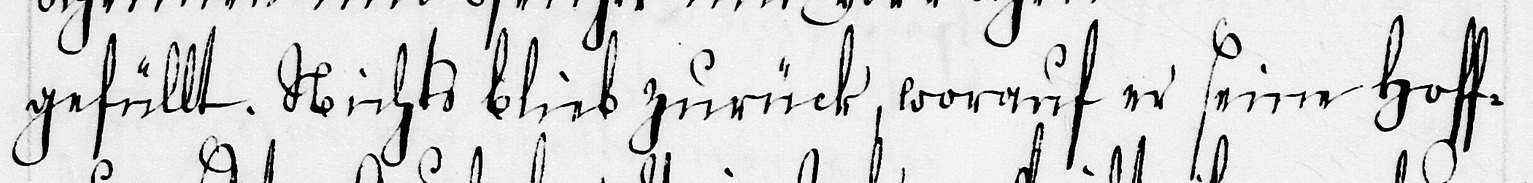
gefüllt. Nichts blieb zurück, worauf er seine Hoff¬
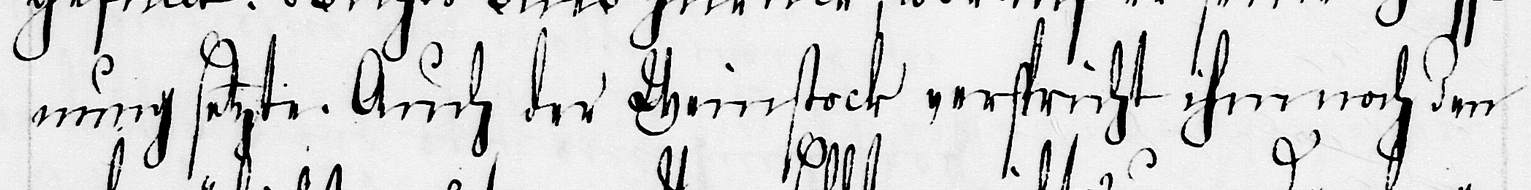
nung setzte. Auch der Weinstock verspricht ihm noch den
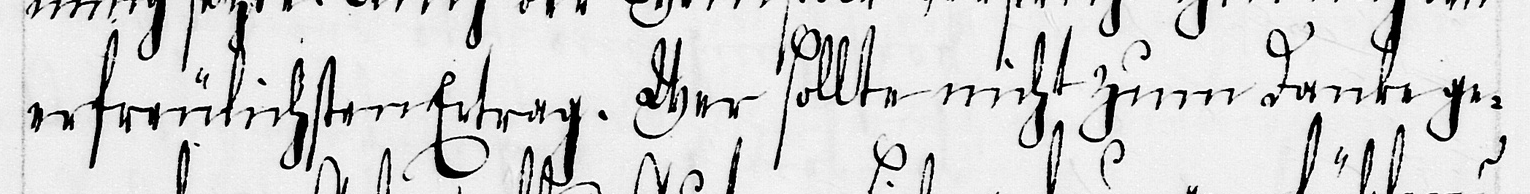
erfreulichsten Ertrag. Wer sollte nicht zum Danke ge¬
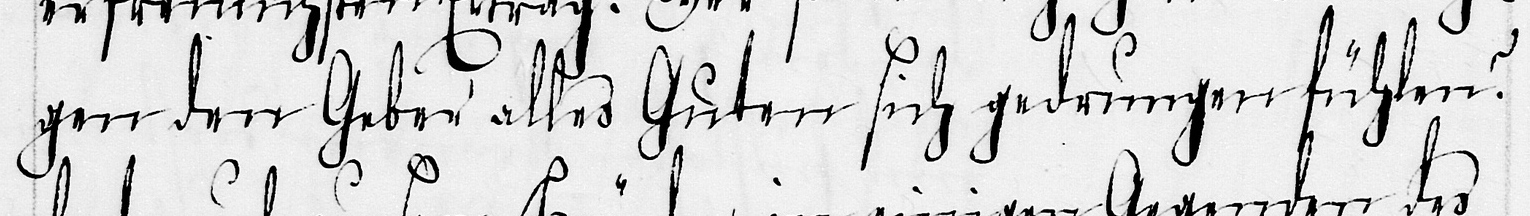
gen den Geber alles Guten sich gedrungen fühlen?
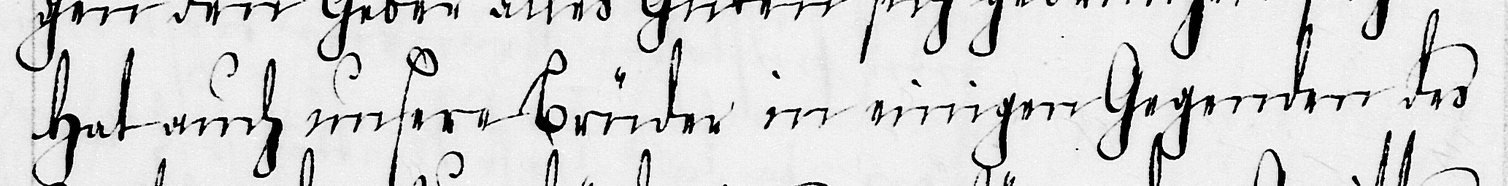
Hat auch unsere Brüder in einigen Gegenden des
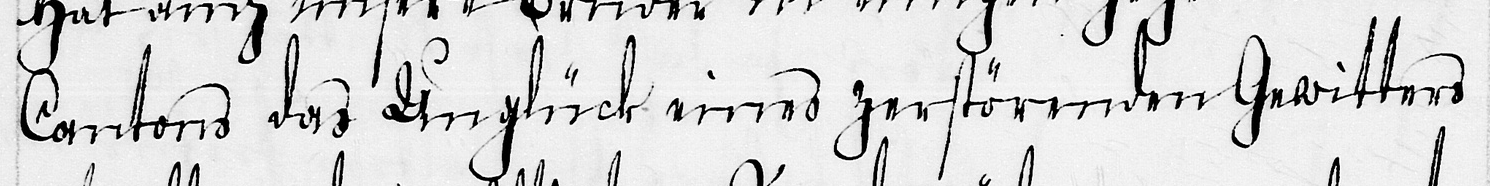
Cantons das Unglück eines zerstörenden Gewitters
